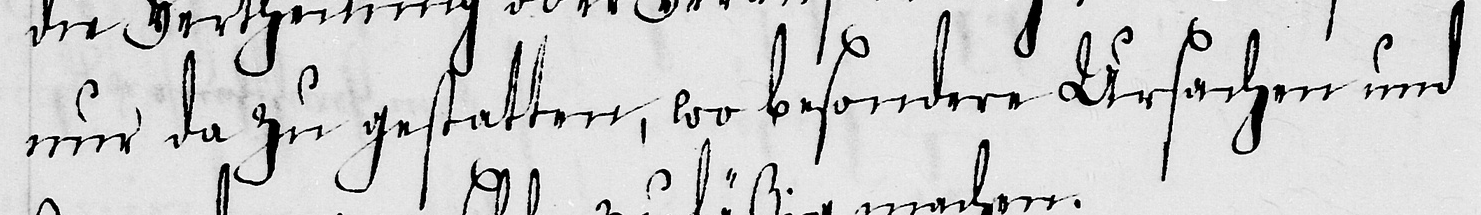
nur da zu gestatten, wo besonders Ursachen und
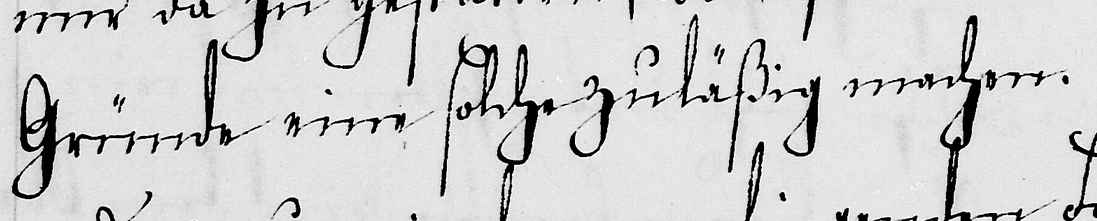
Gründe eine solche zuläßig machen.
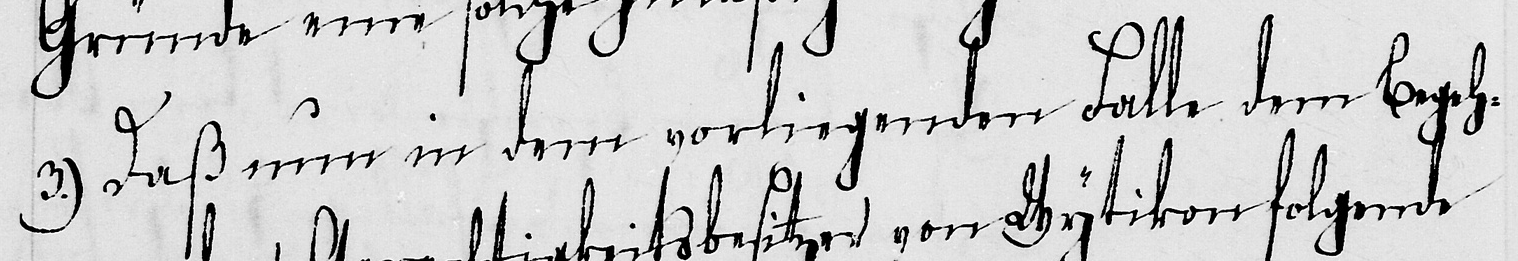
3.) Daß nun in dem vorliegenden Falle dem Begeh¬
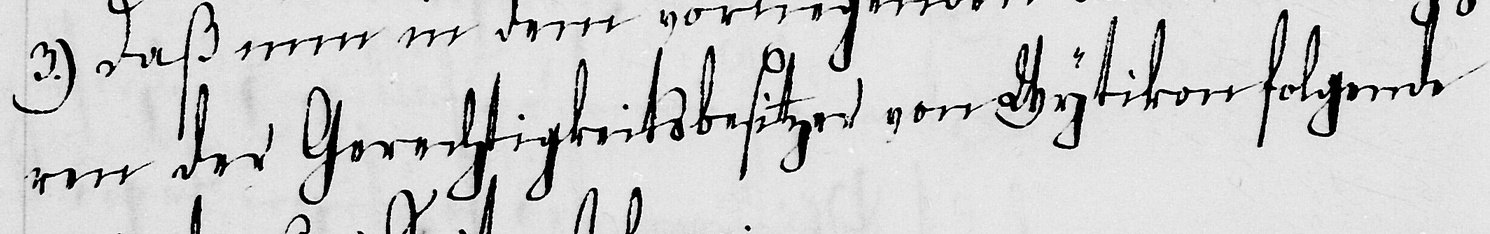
ren der Gerechtigkeitsbesitzer von Wytikon folgende
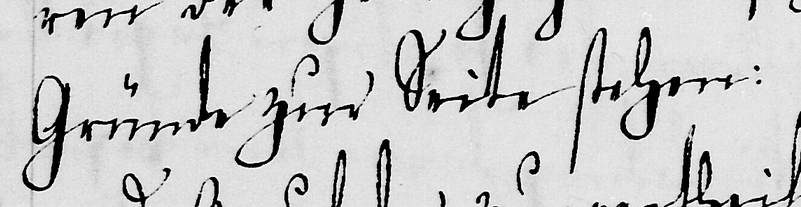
Gründe zur Seite stehen:
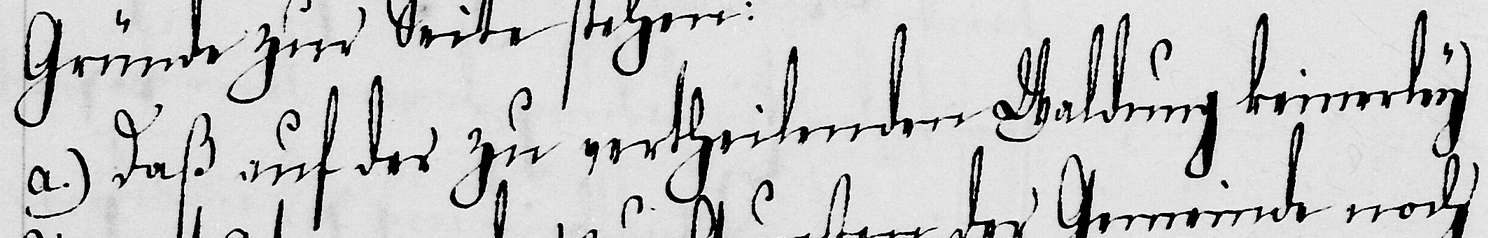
a.) Daß auf der zu vertheilenden Waldung keinerley
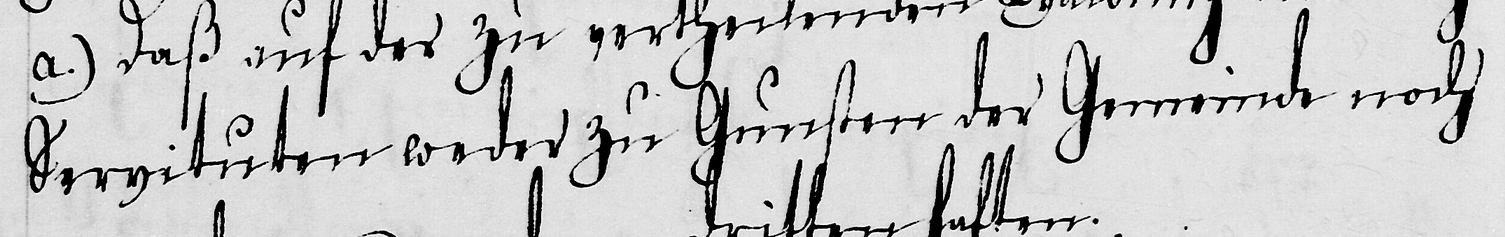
Servituten weder zu Gunsten der Gemeinde noch
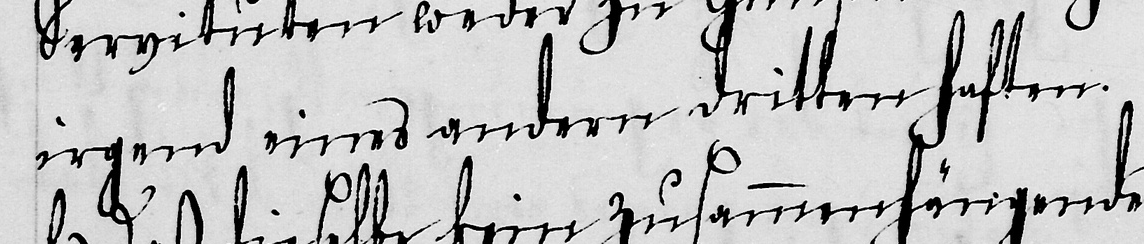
irgend eines andern dritten haften.
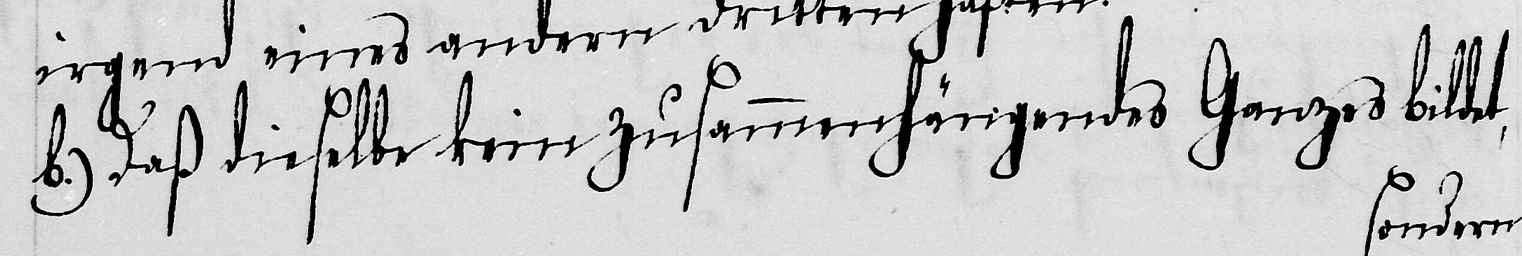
b.) Daß dieselbe kein zusammenhängendes Ganzes bildet,
